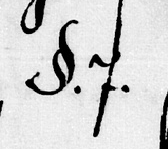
§. 7.
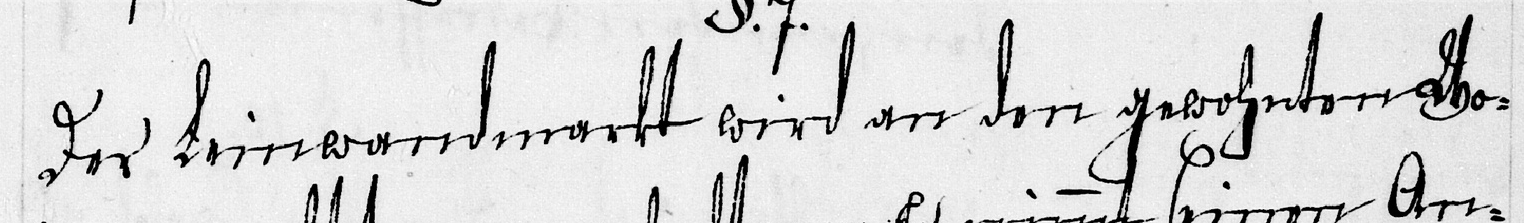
Der Leinwandmarkt wird an den gewohnten Wo¬
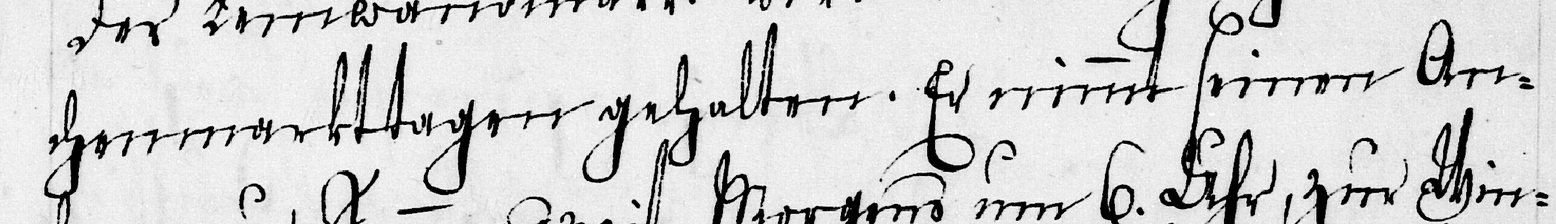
chenmarkttagen gehalten. Er nimmt seinen An¬
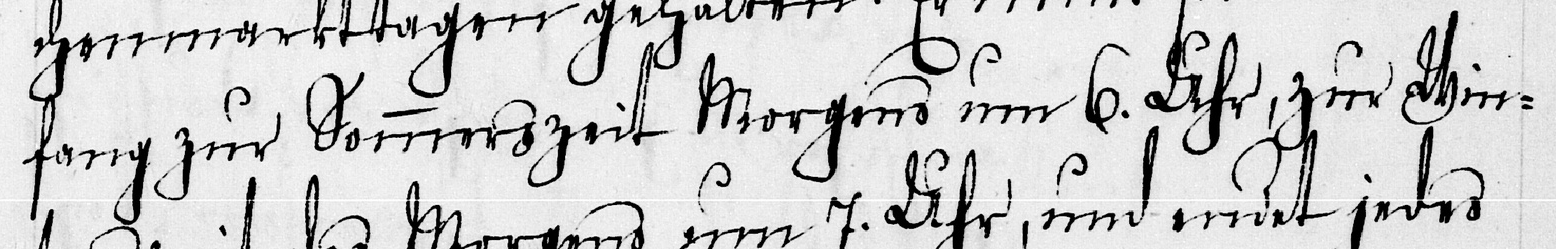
fang zur Sommerszeit Morgens um 6. Uhr, zur Win¬
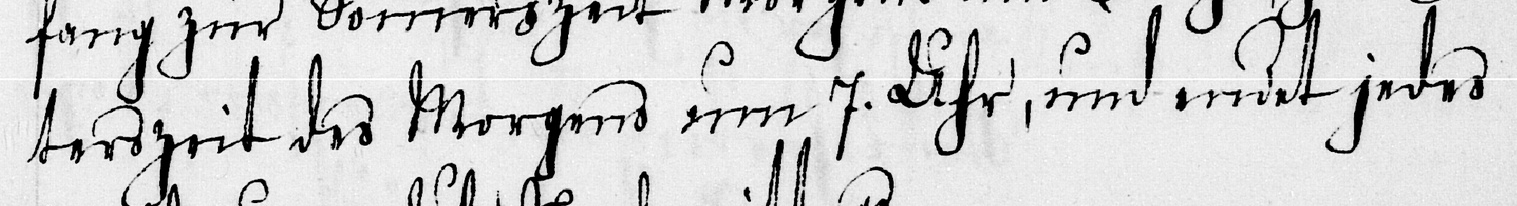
terszeit des Morgens um 7. Uhr, und endet jedes
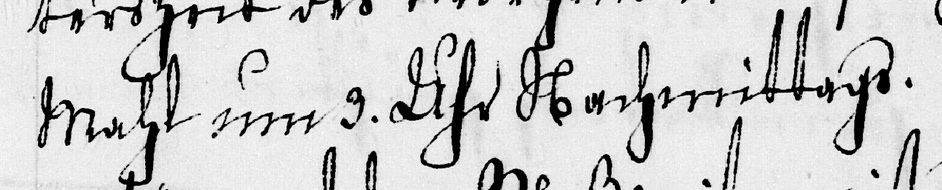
Mahl um 3. Uhr Nachmittags.
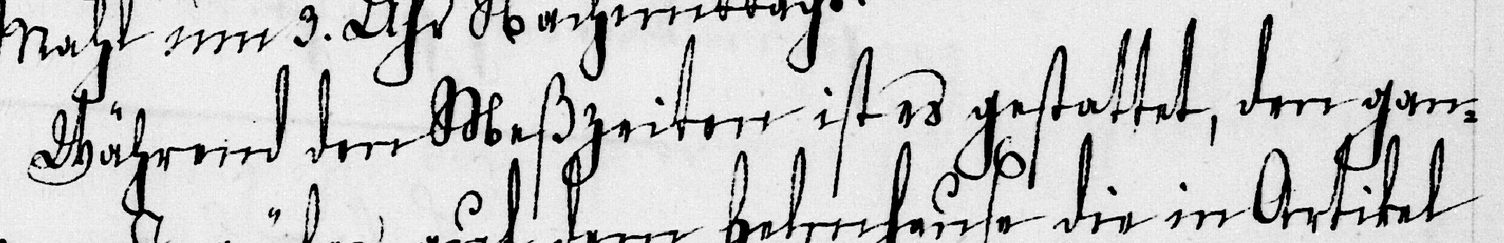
Während den Meßzeiten ist es gestattet, den gan¬
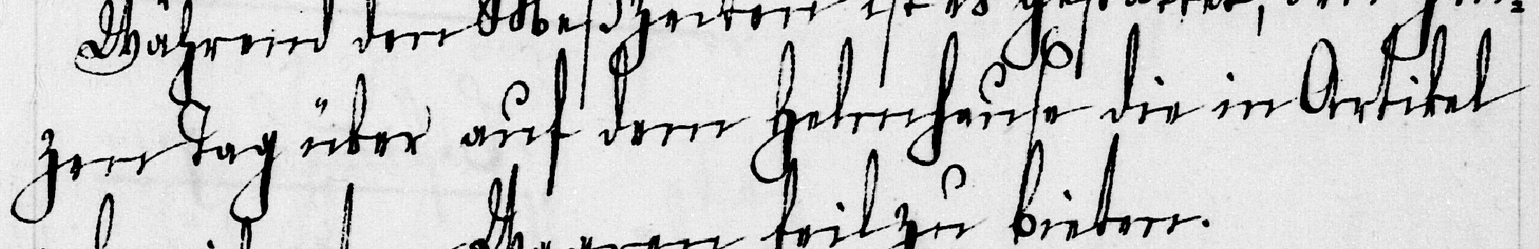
zen Tag über auf dem Helmhause die in Artikel
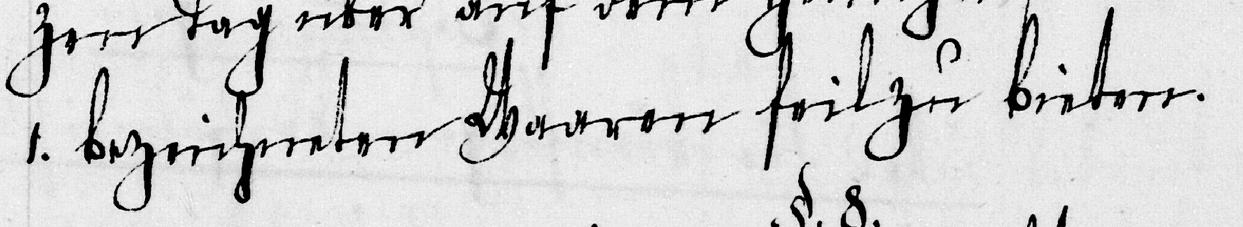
1. bezeichneten Waaren feil zu bieten.
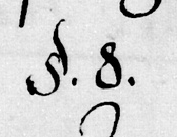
§. 8.
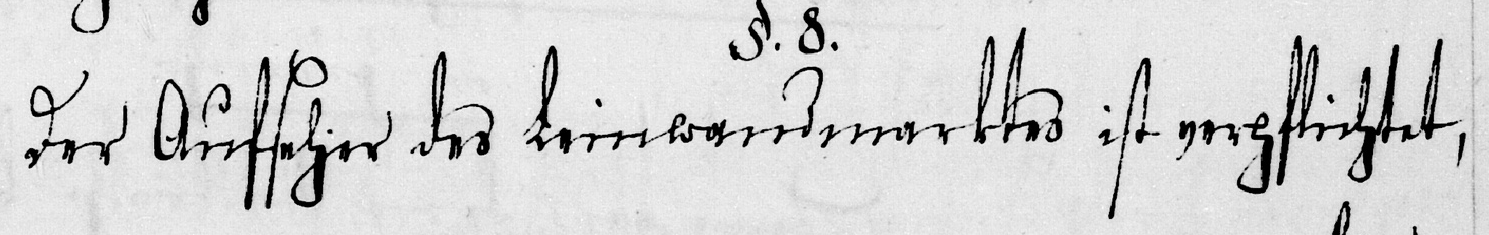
Der Aufseher des Leinwandmarktes ist verpflichtet,
